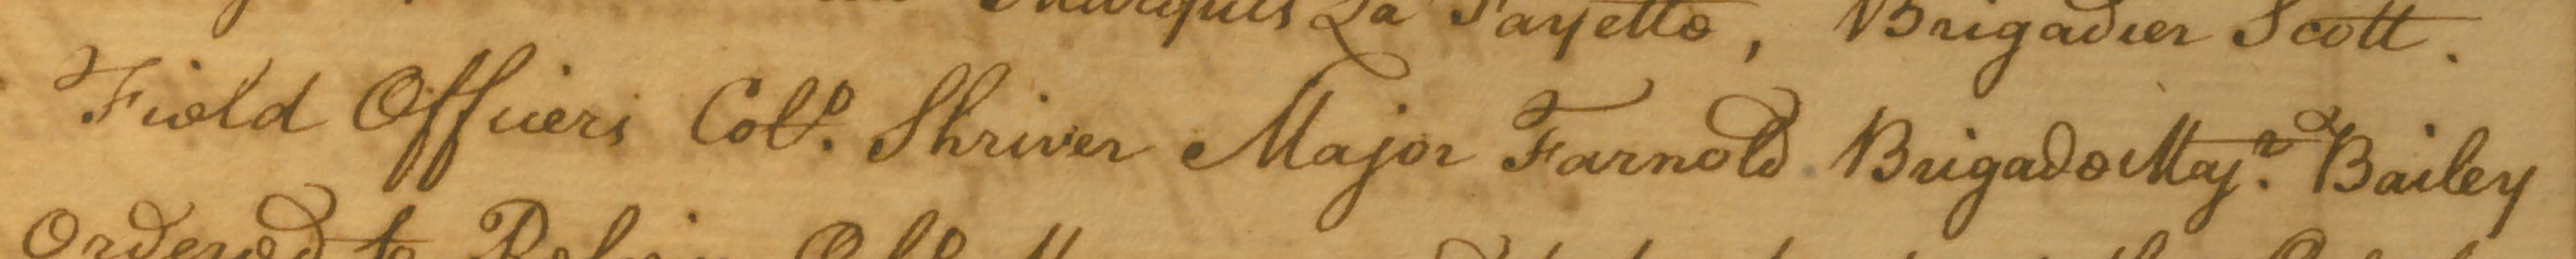Field Officers Col^o. Shriver Major Farnold Brigade Maj^r. Bailey
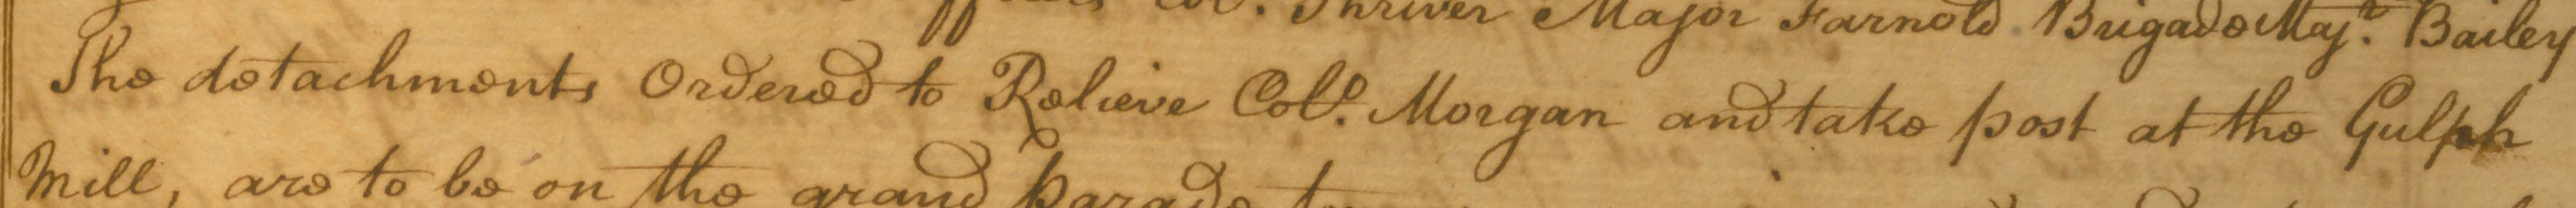The detachments ordered to Relieve Col^o. Morgan and take post at the Gulph
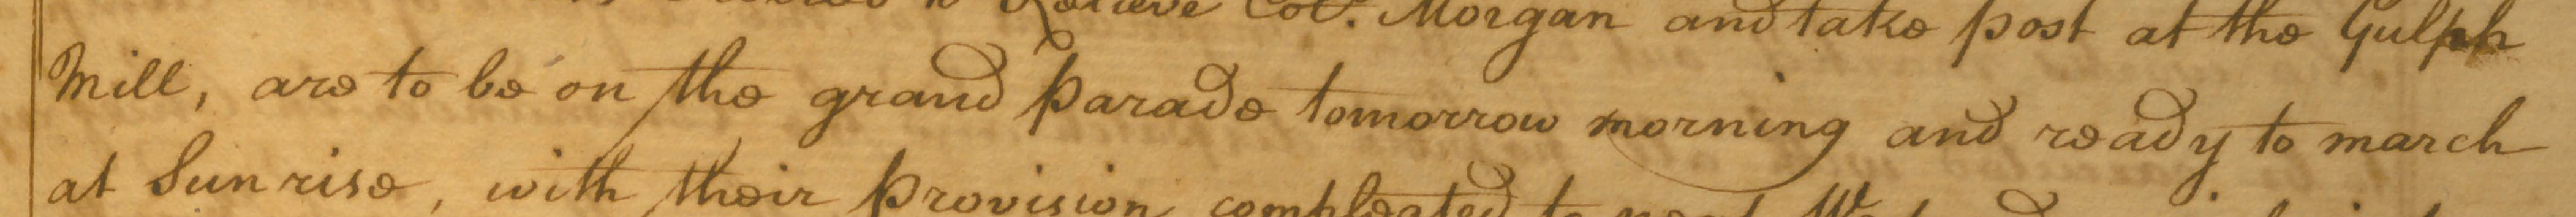Mill, are to be on the grand parade tomorrow morning and ready to march
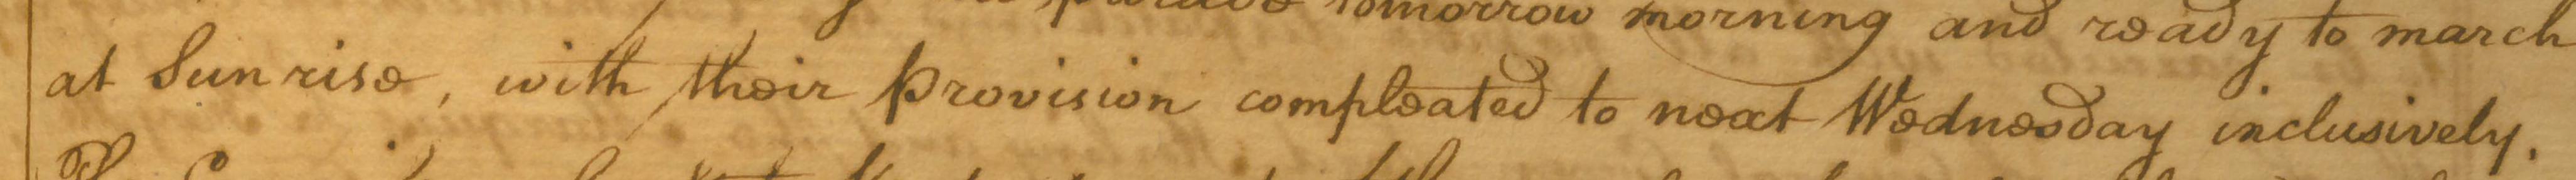at Sunrise, with their provision compleated to next Wednesday inclusively.
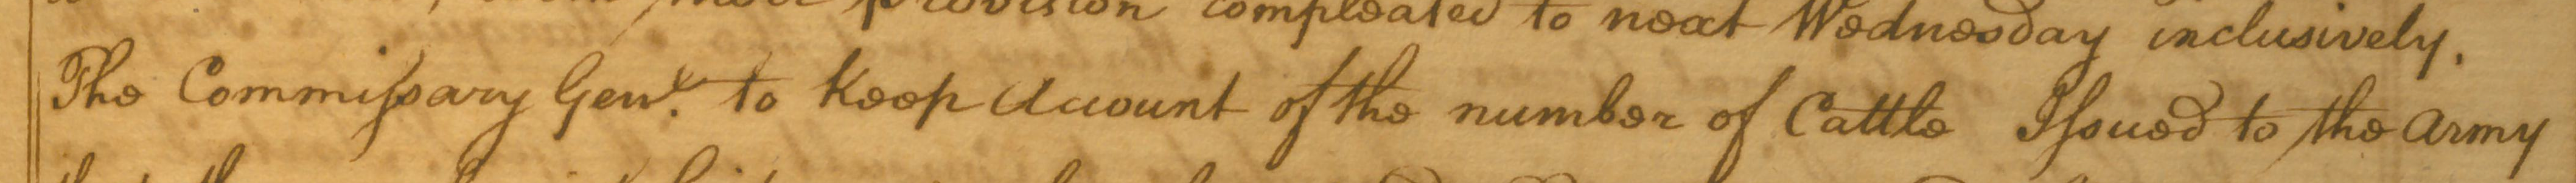The Commissary Gen^l. to keep account of the number of Cattle Issued to the army
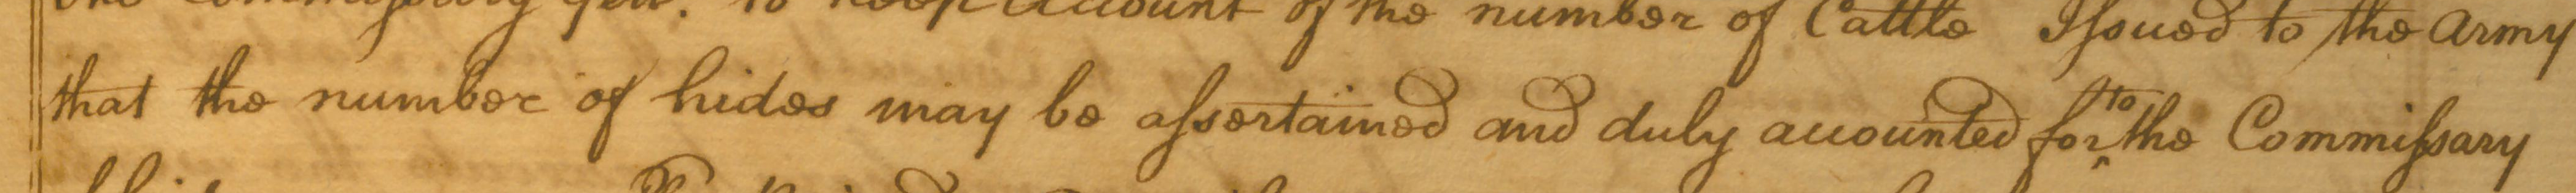that the number of hides may be assertained and duly accounted for ^to the Commissary
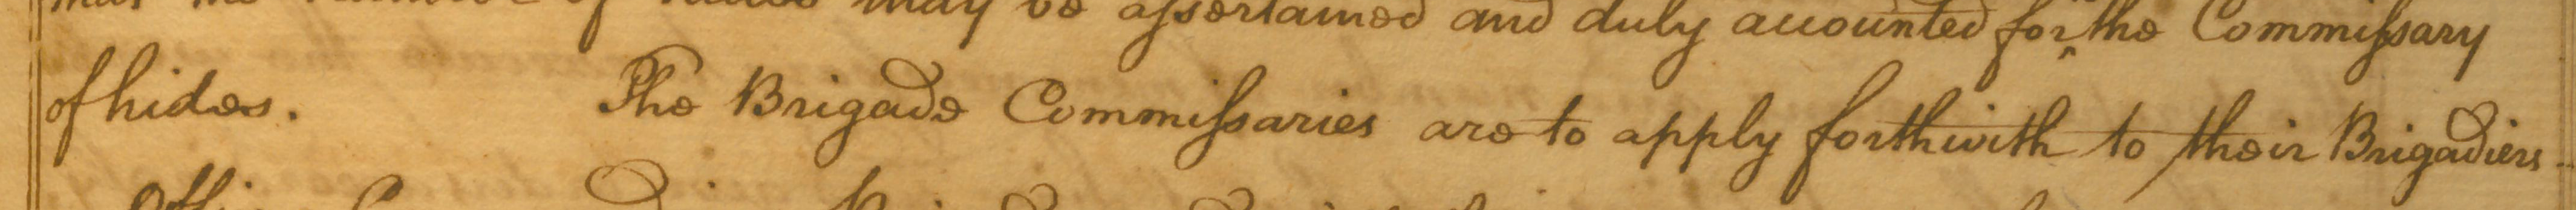of hides. The Brigade Commissaries are to apply forthwith to their Brigadiers
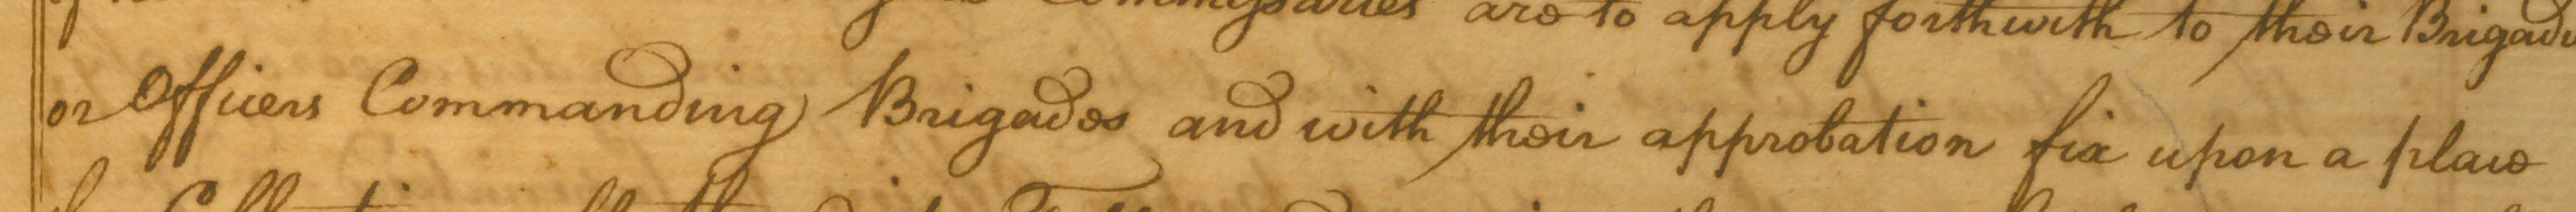or Officers Commanding Brigades and with their approbation fix upon a place
